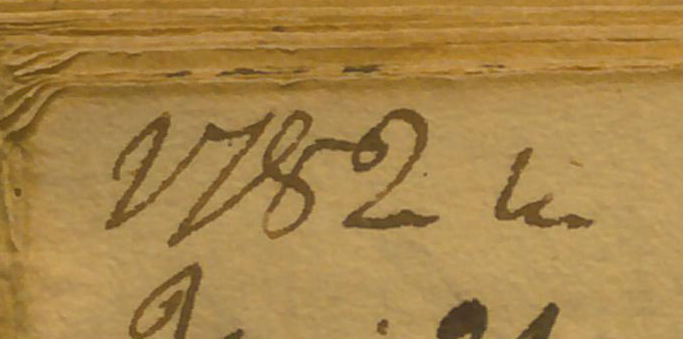1782
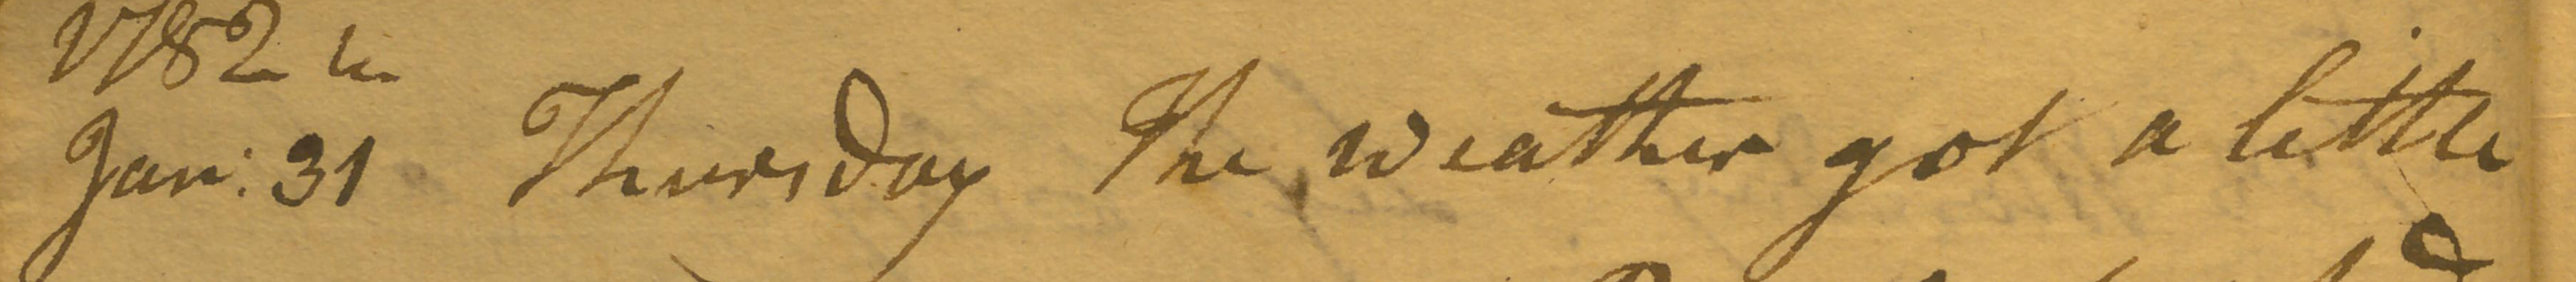Jan: 31^th Thursday The weather got a little
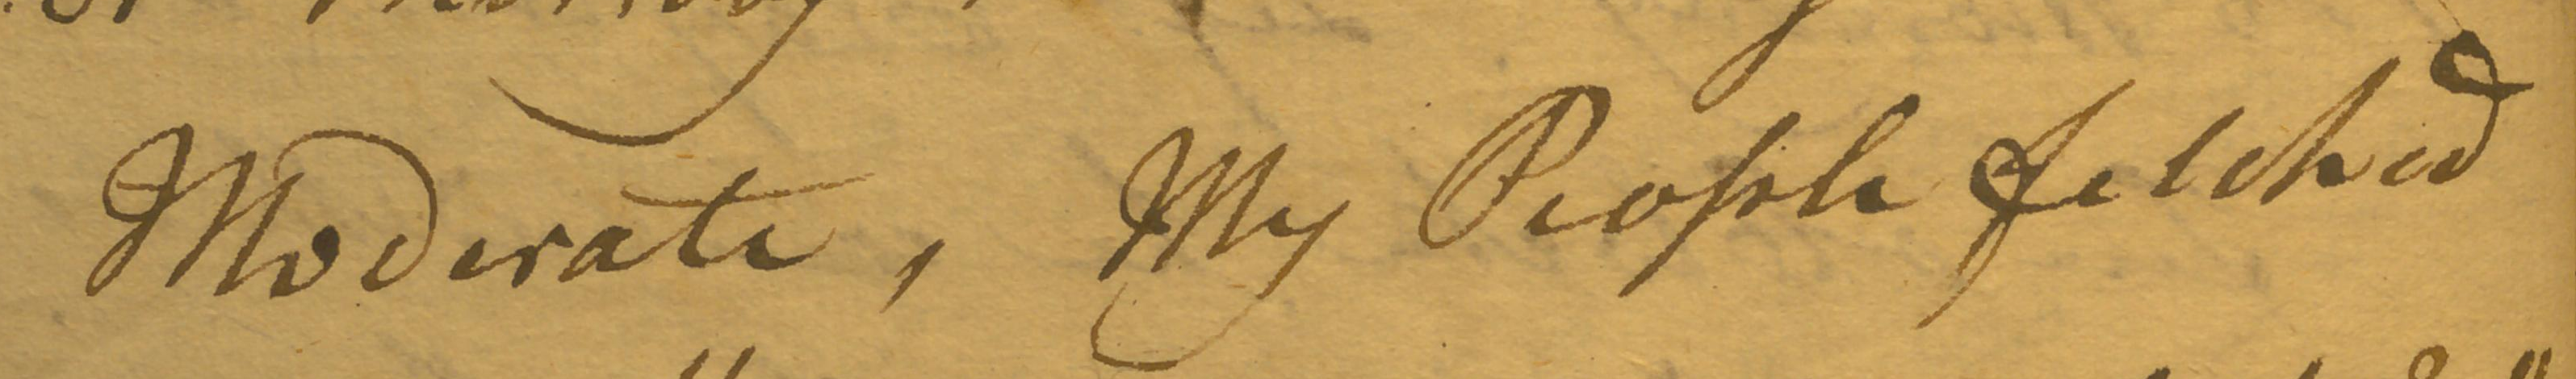Moderate, My People fetched
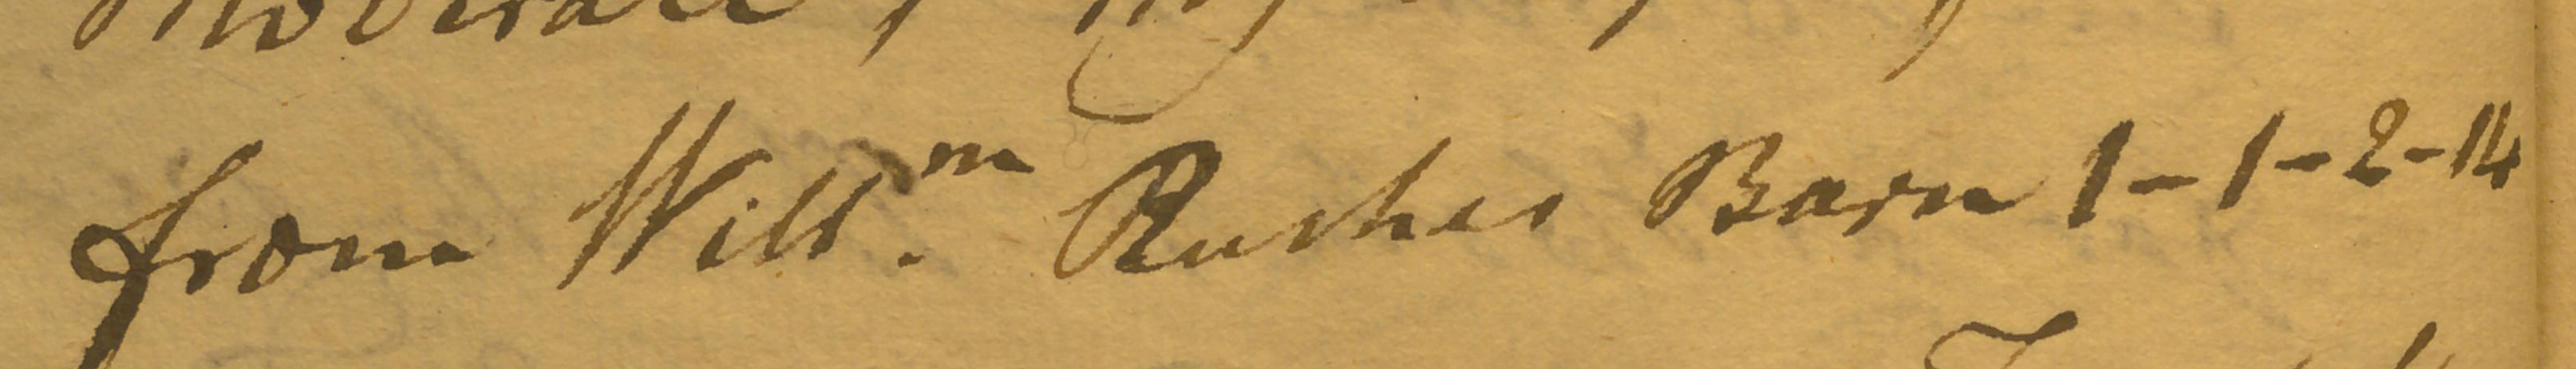from Will^m. Rushes Barn 1-1-2-14
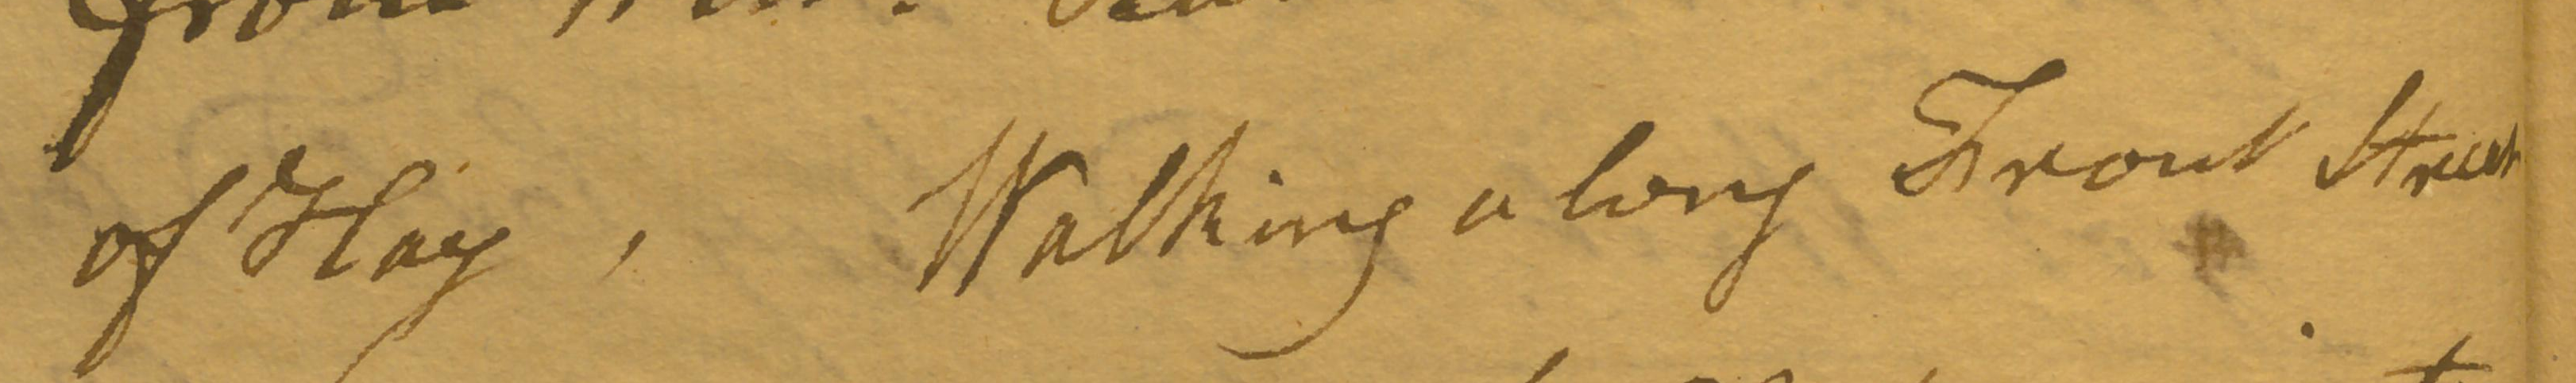of Hay, Walking along Front Street
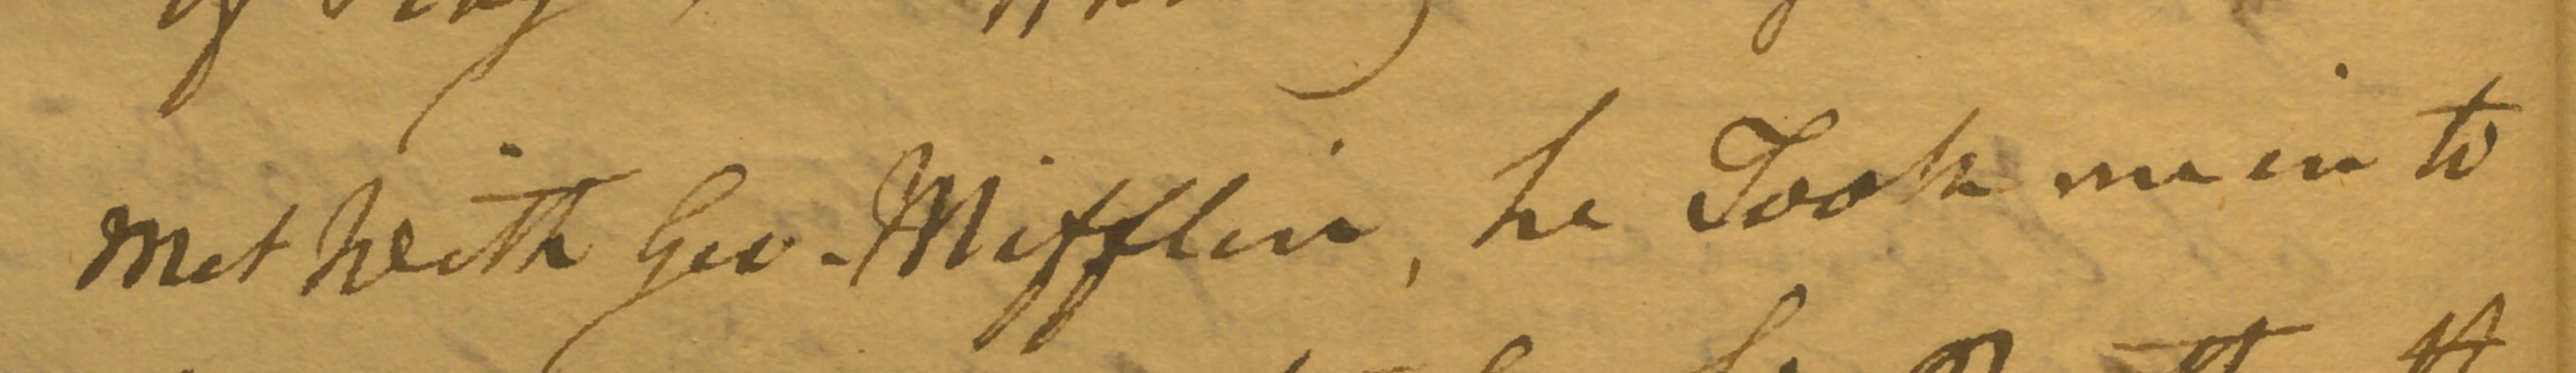met with Gen. Mifflin he Took me in to
